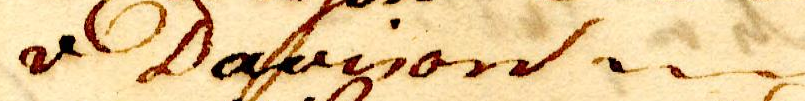v Davison-
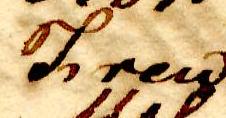Trew
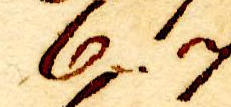6.7
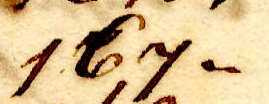167
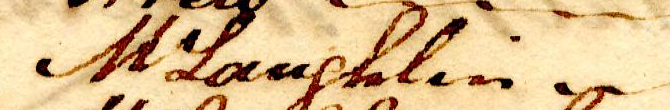M^cLaughlin
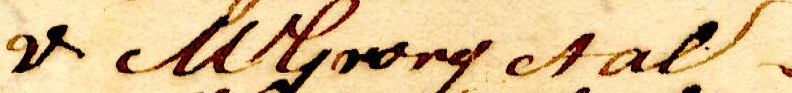v M^cGrory et al
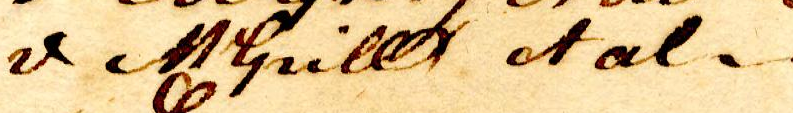v M^cGillt et al-
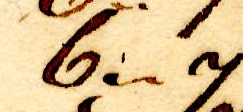6.7
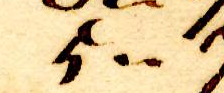5.7
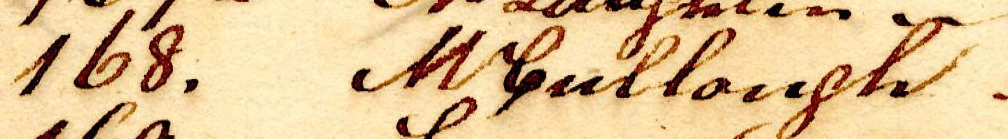168. M^cGullough
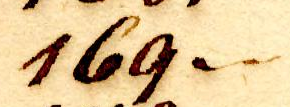169
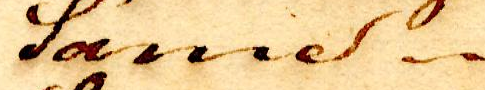Same
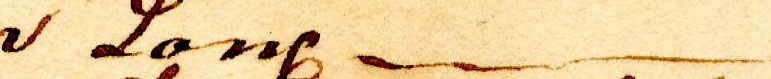v Long-
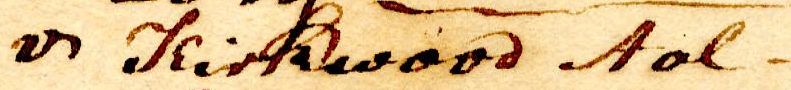v Kirkwood et al
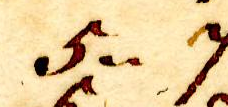5.7
